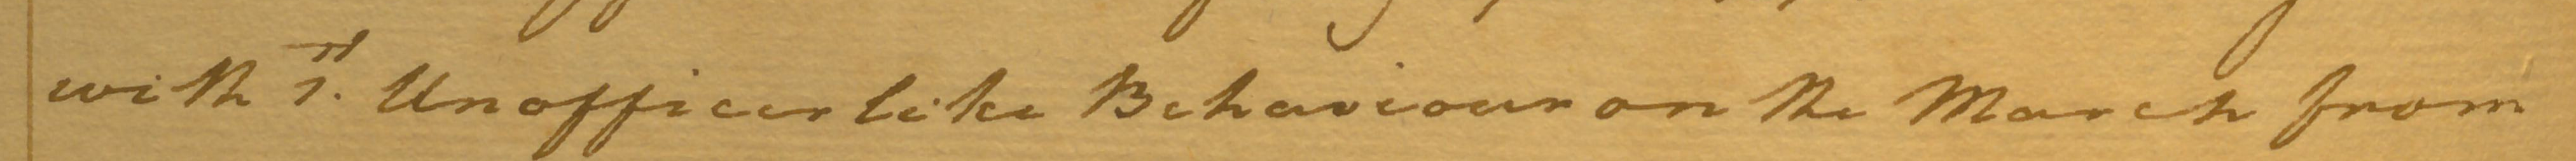with 1^st. Unofficerlike Behaviour on the March from
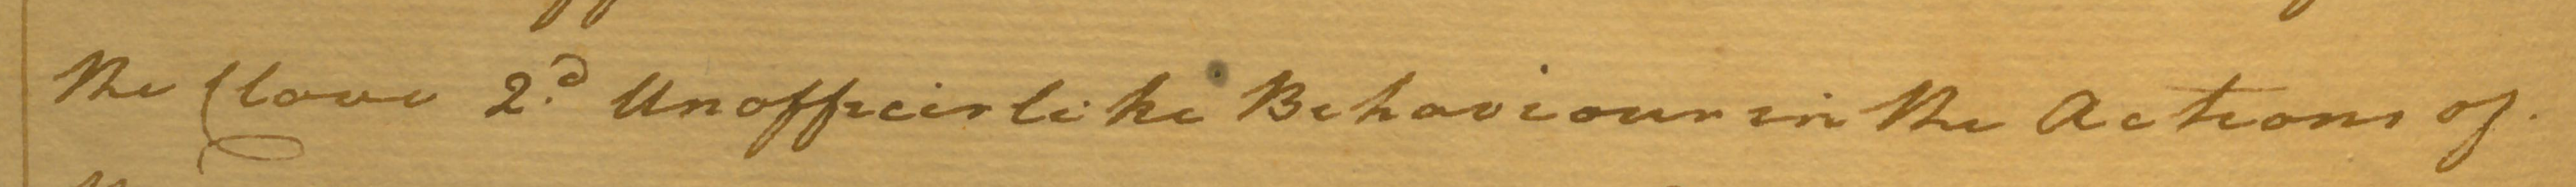the Clove 2^d. Unofficerlike Behaviour in the Actions of
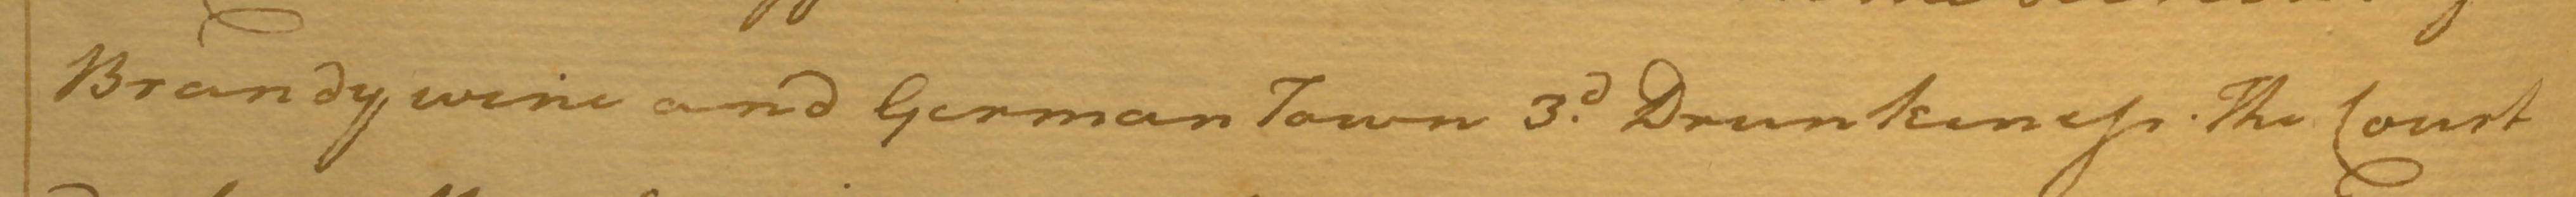Brandywine and German Town 3^d. Drunkeness. The Court
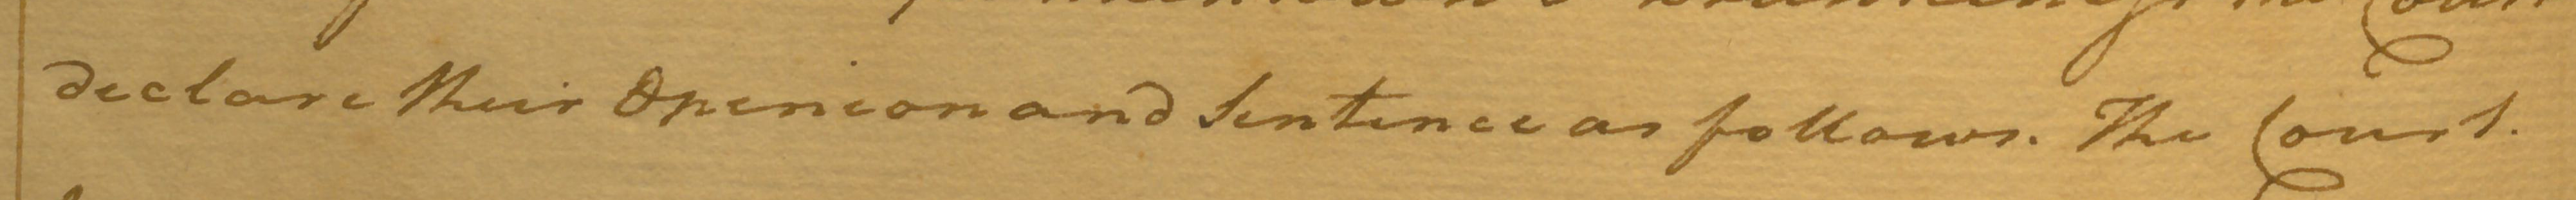declare their Opinion and Sentence as follows. The Court
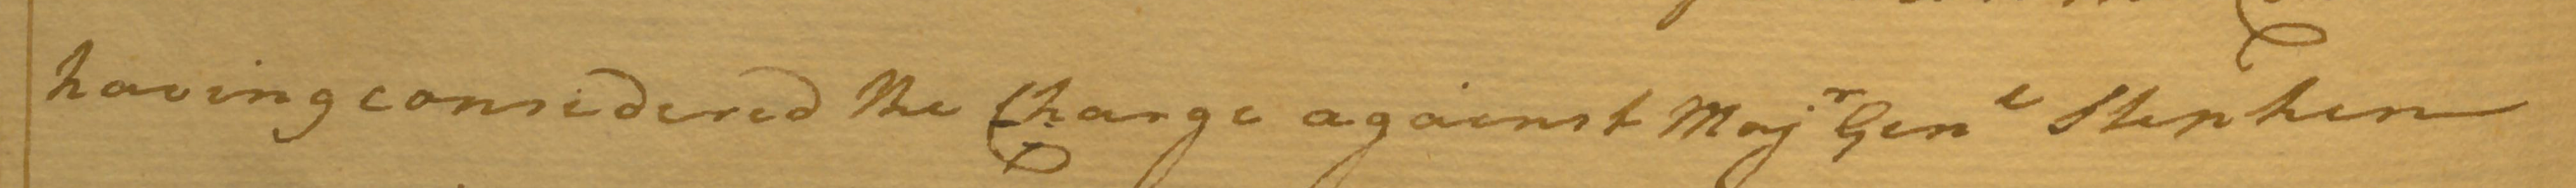having considered the Charge against Maj^r. Gen^l. Stephen
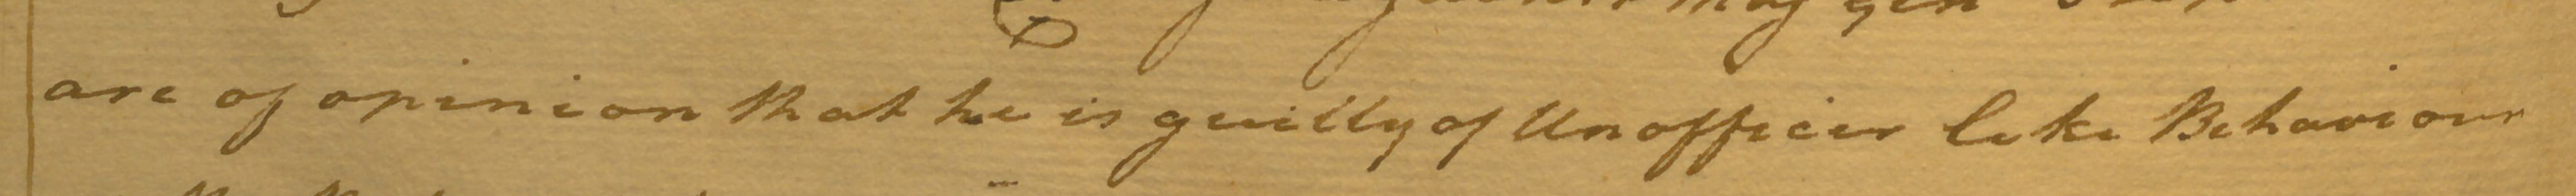are of opinion that he is guilty of Unofficer like Behaviour
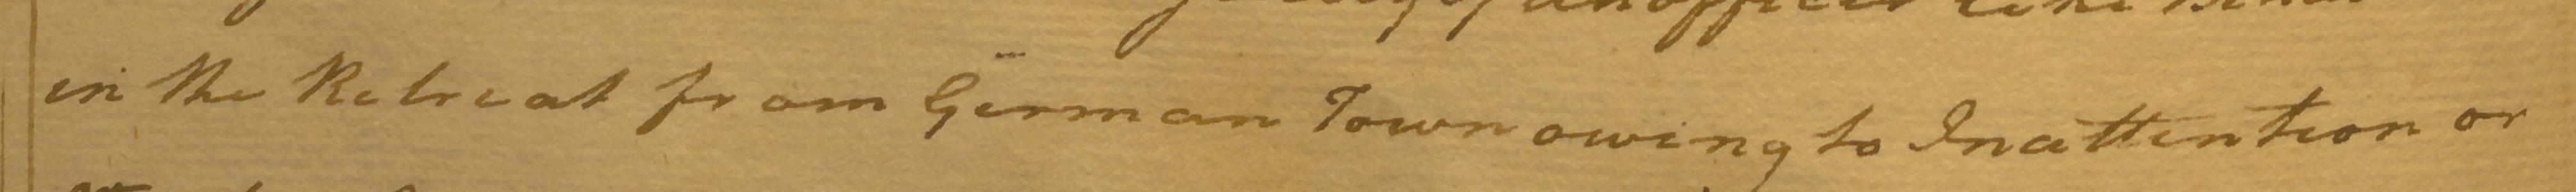in the Retreat from German Town owing to Inattention or
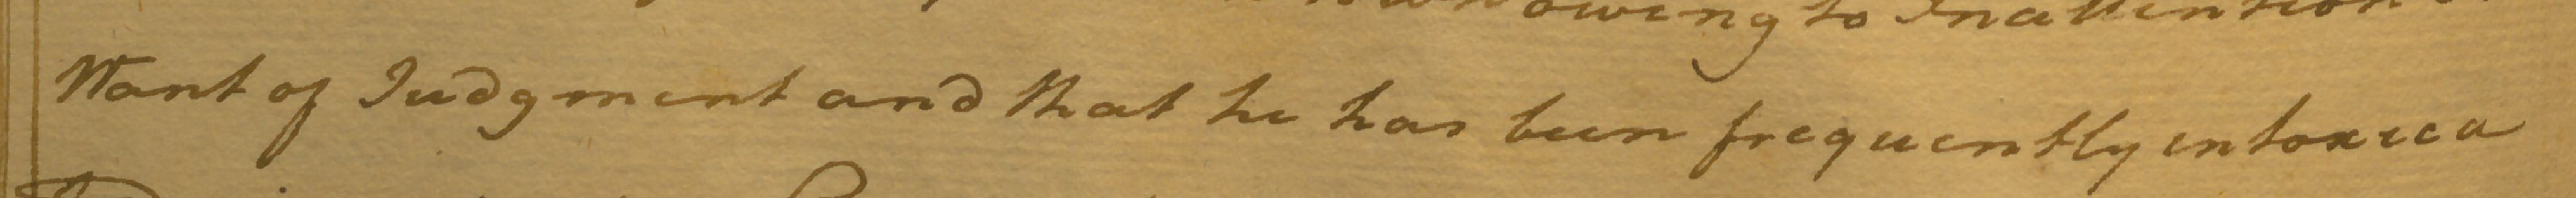Want of Judgment and that he has been frequently intoxica
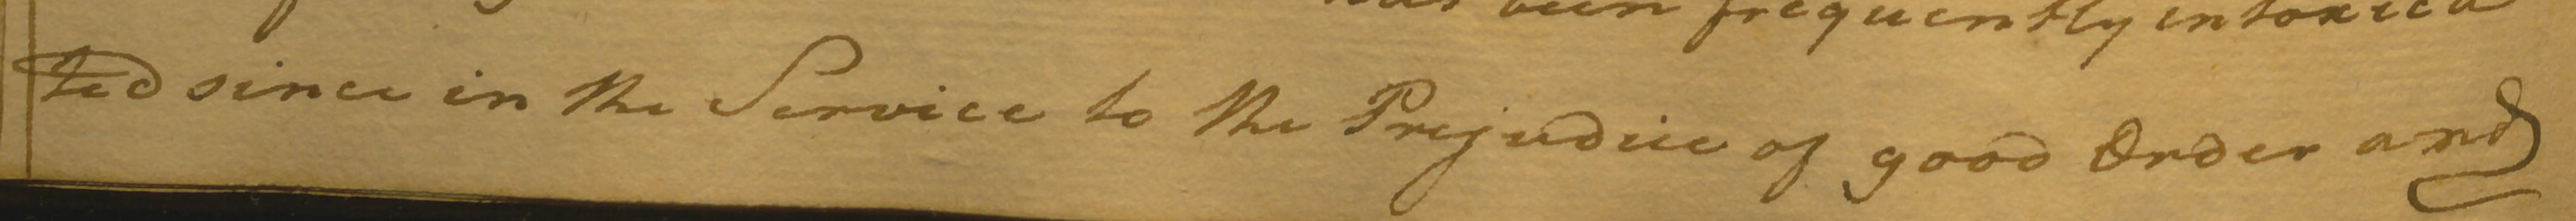ted since in the Service to the Prejudice of good Order and
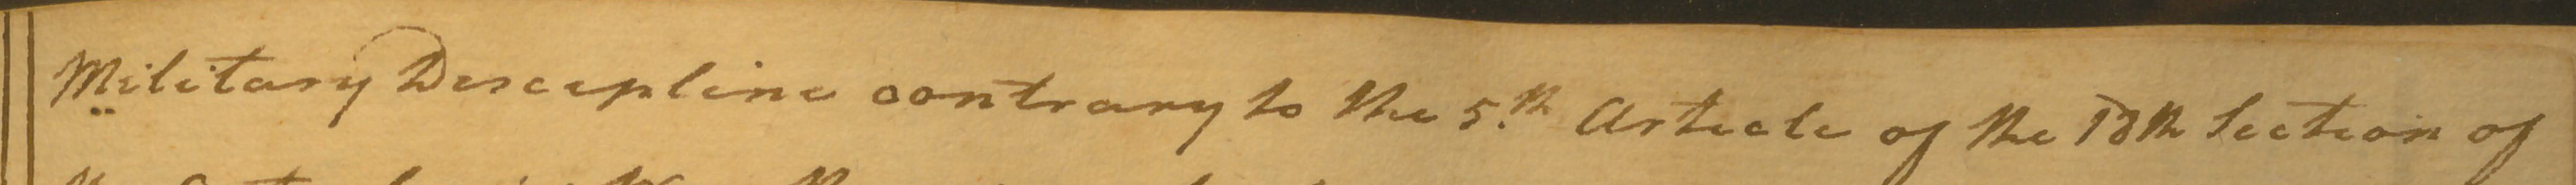Military Discipline contrary to the 5^th. Article of the 18th Section of
